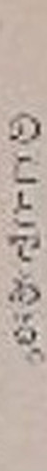のことである。
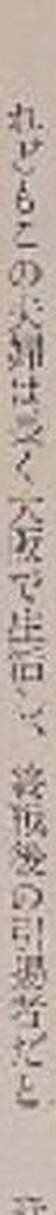れどもこの夫婦は長く大阪で生活し、終戦後の引揚者だと
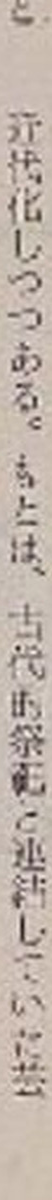近代化しつつある。もとは、古代的祭祀と連結していた芸
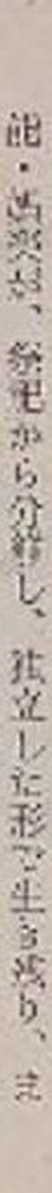能・娯楽が、祭祀から分岐し、独立した形で生き残り、ま
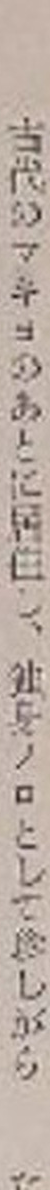古代のマキヨのあとに居住し、独身ノロとして珍しがら
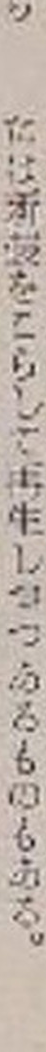たは新装をこらして再生しつつあるものもある。
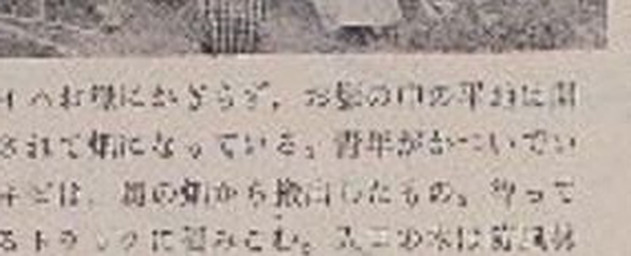墾されて畑になっている。青年がかついでい

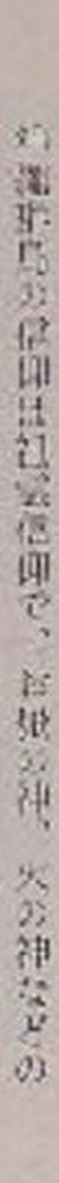沖縄群島の信仰は祖霊信仰で、お嶽の神、火の神などの
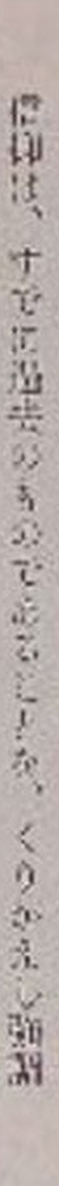信仰は、すでに過去のものであることを、くりかえし強調
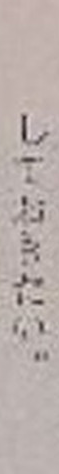しておきたい。
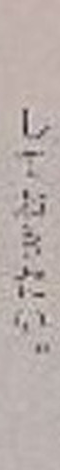しておきたい。
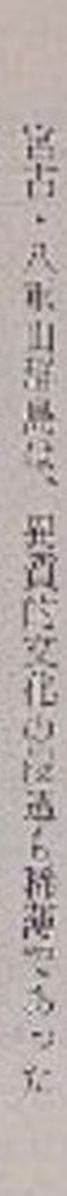宮古・八重山群島は、異質的文化の侵透も稀薄であった
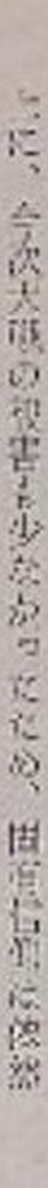上に、今次大戦の被害も少なかったため、固有信仰は依然
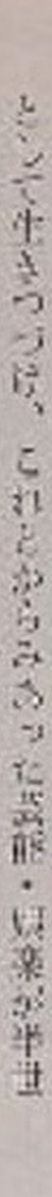として生きつづけ、これとからみあった芸能・娯楽が半世
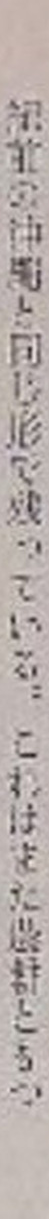紀前の沖縄と同じ形で残っている。これはまた農耕ともつ
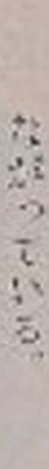ながっている。
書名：沖縄固有信仰のおとろえ
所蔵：University of the Ryukyus Library
